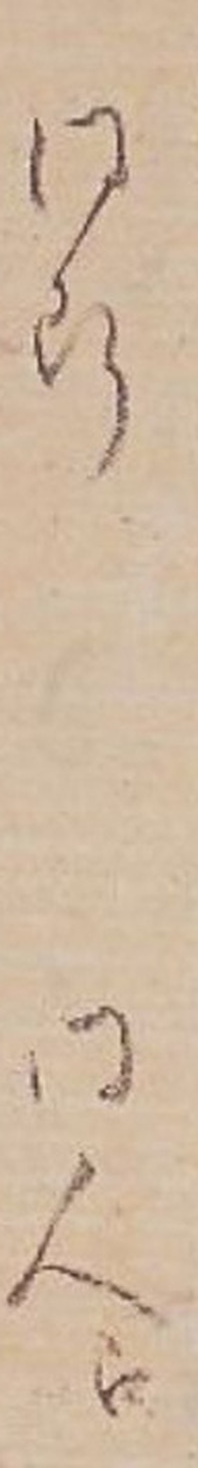同断同人え
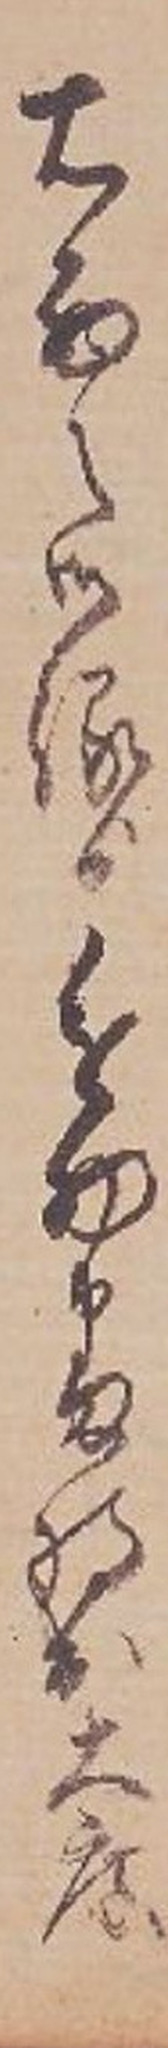右西之御縁ゟ進物番持出大広

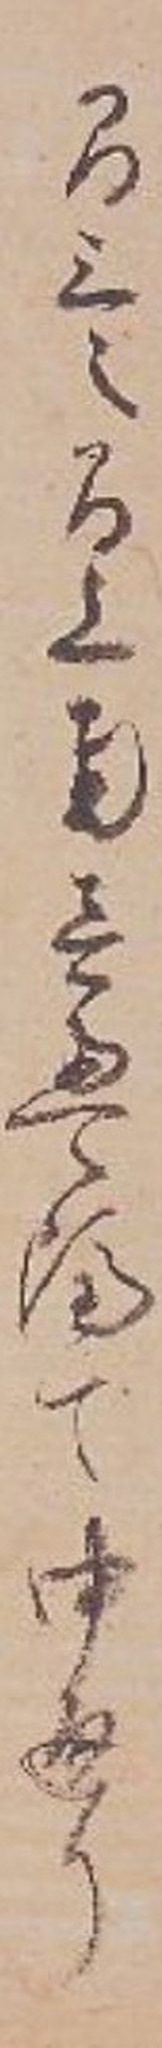間三之間上南壱畳隔て中通り
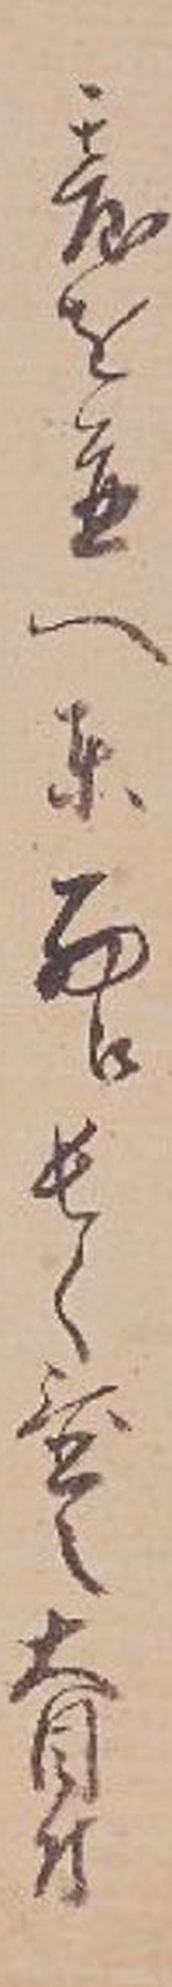台を並へ東西え長く置之大目付
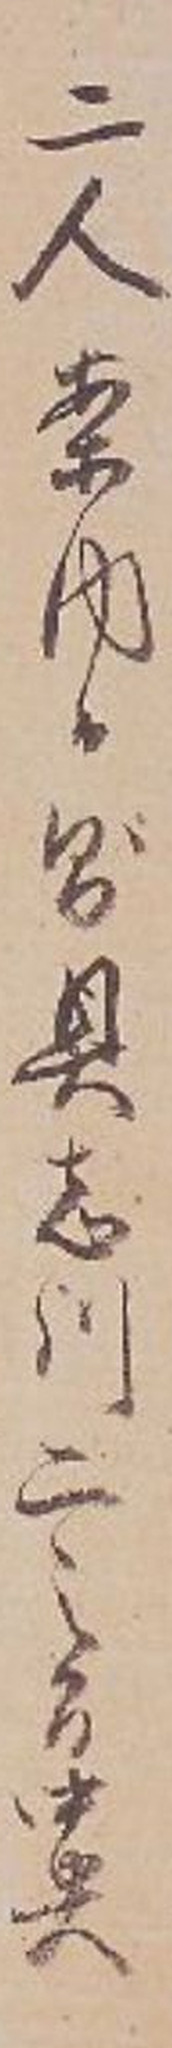二人案内而則具志川二之間中央
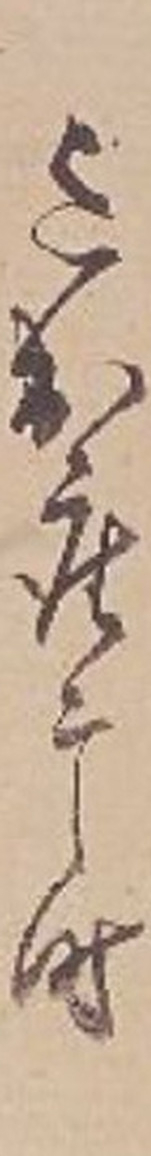迄出座之時
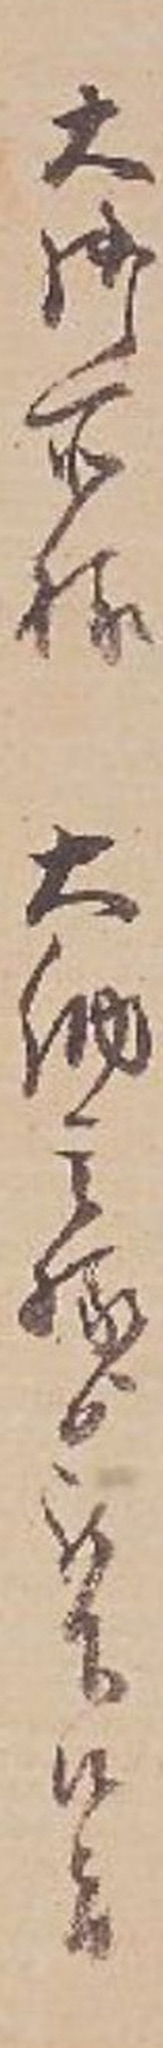大御所様大納言様ゟ被下候旨
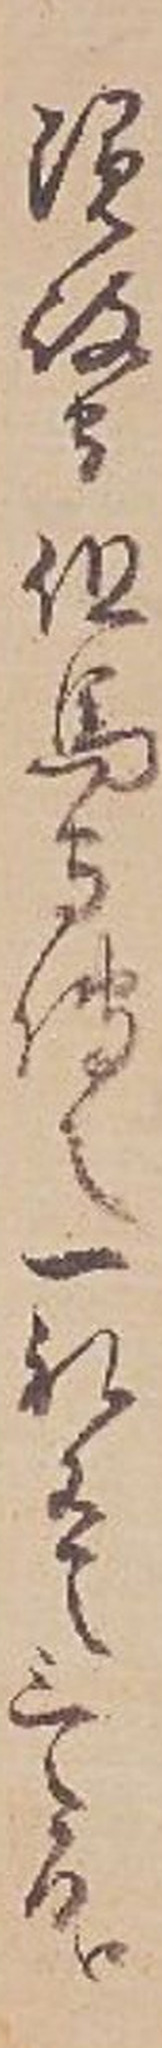隠岐守但馬守伝之一礼有之三之間え
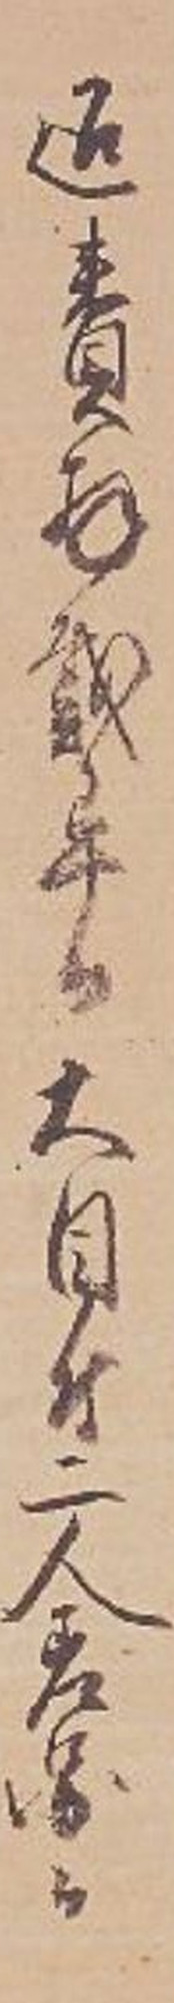退賚拝戴畢而大目付二人差図而
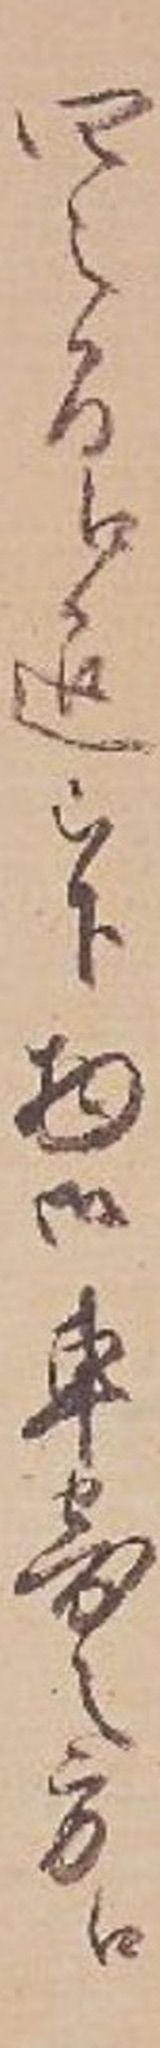四之間え退被下物御車寄之方え
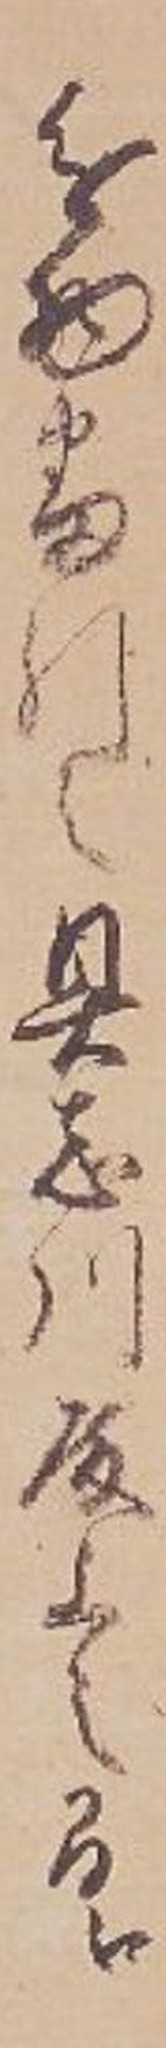進物番引之具志川殿上之間え
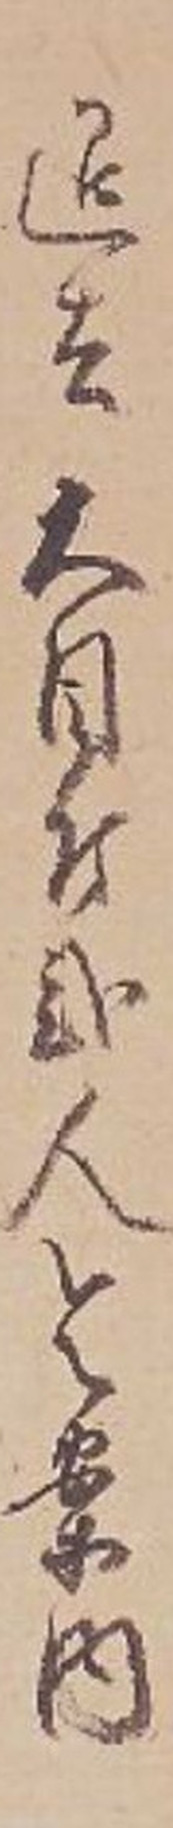退去大目付弐人令案内
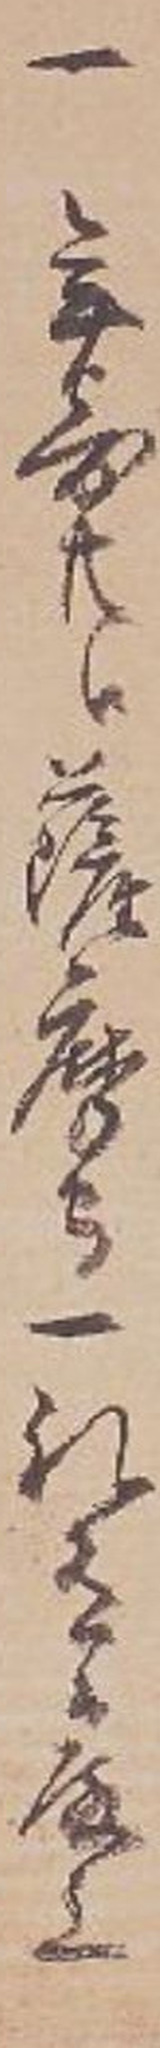一年寄共え薩摩守一礼有而殿上
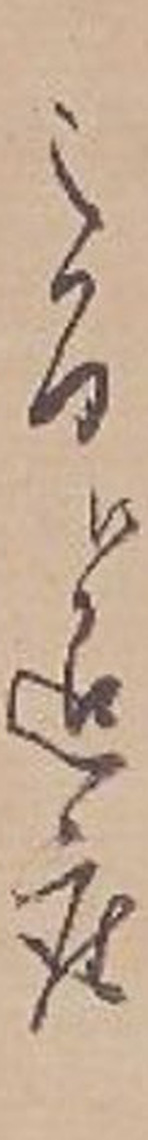之間え退座

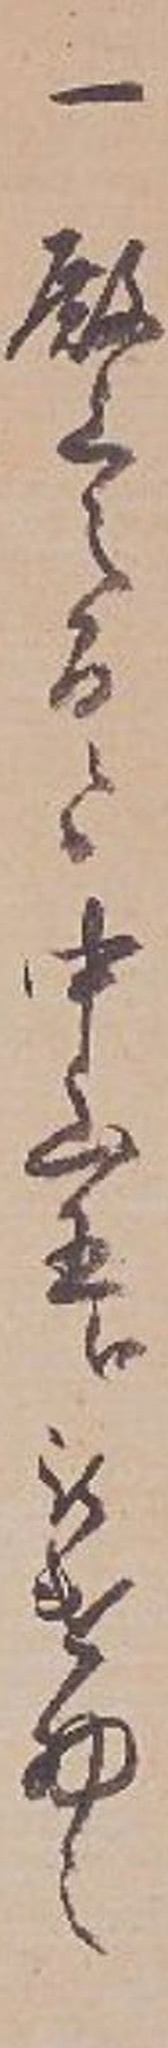一殿上之間に而中山王え被遣物之
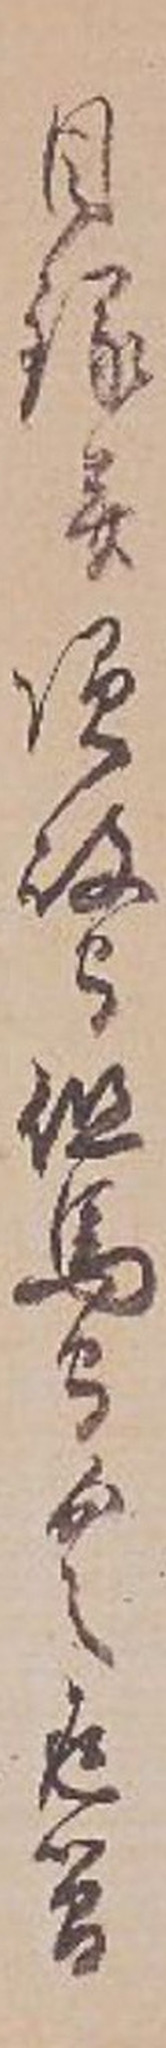目録幷隠岐守但馬守ゟ之返簡
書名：琉球人来朝記 八、九
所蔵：University of the Ryukyus Library
